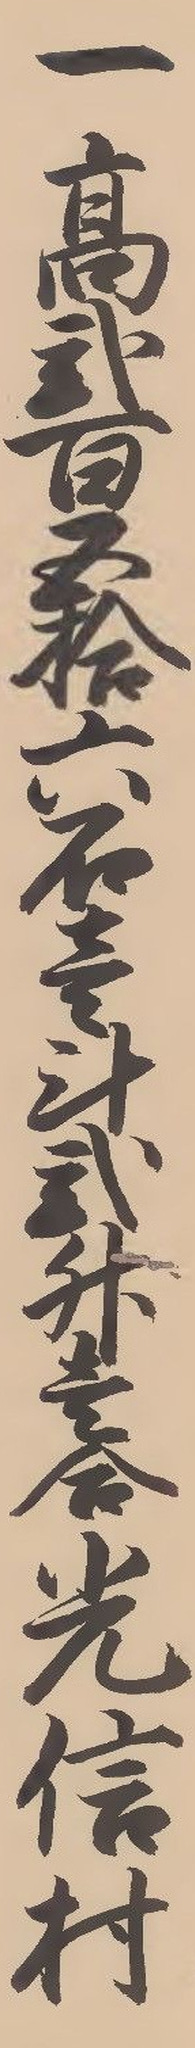一高弐百五拾六石壱斗弐升壱合光信村
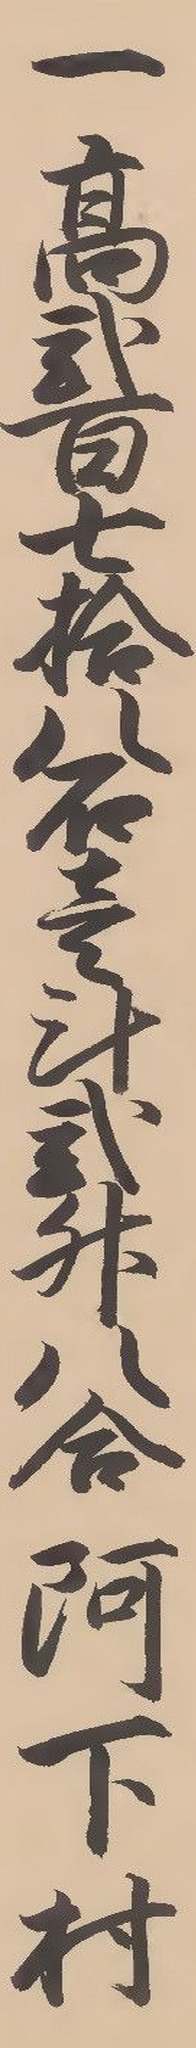一高弐百七拾八石壱斗弐升八合阿下村
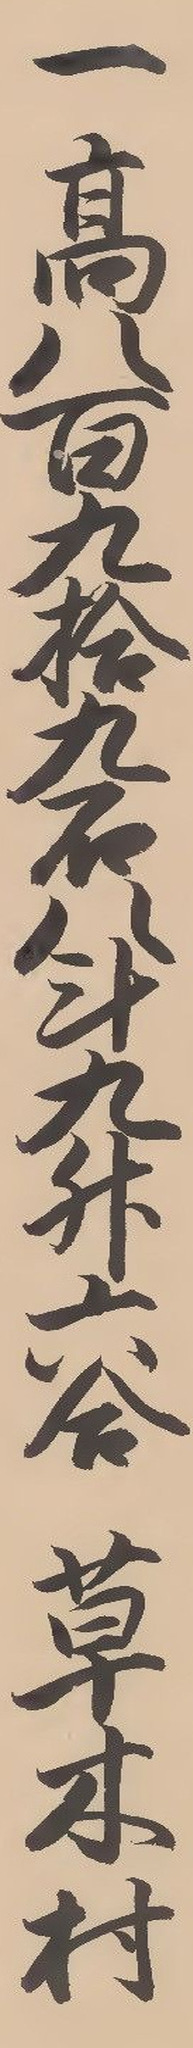一高八百九拾九石八斗九升六合草木村
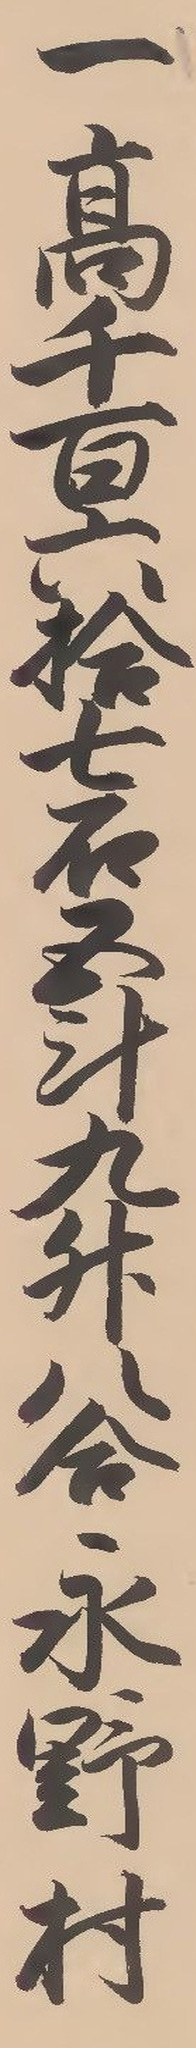一高千百六拾七石五斗九升八合永野村
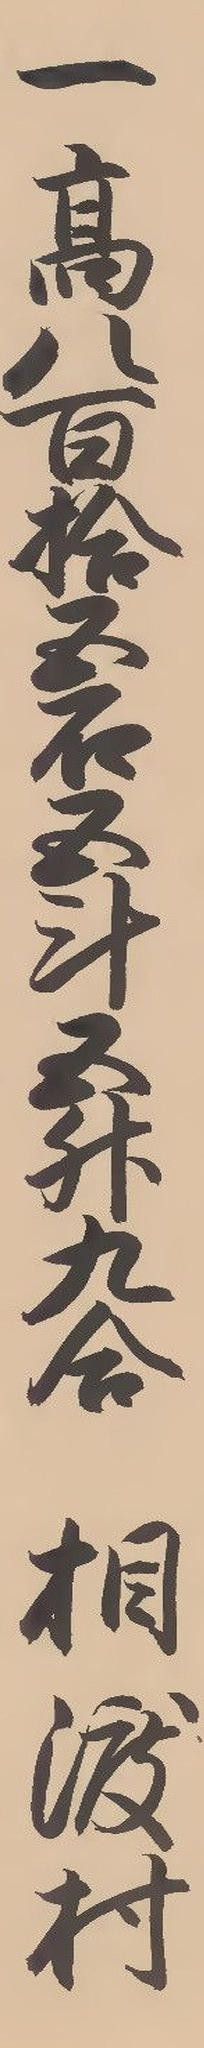一高八百拾五石五斗五升九合相渡村
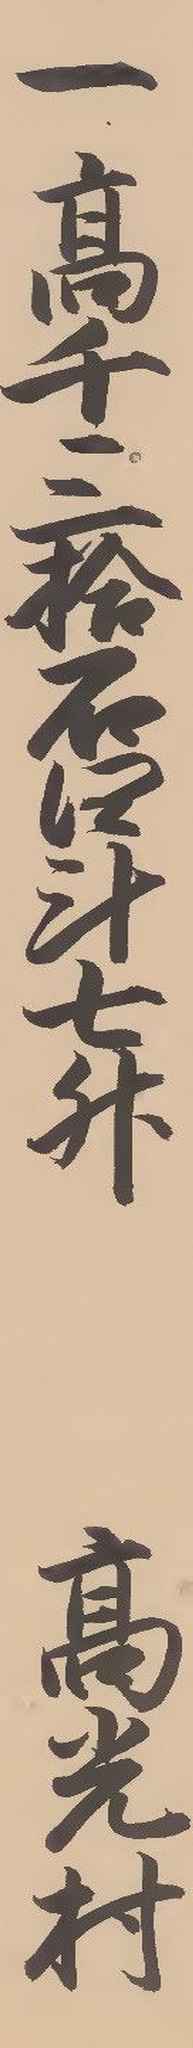一高千三拾石四斗七升高光村
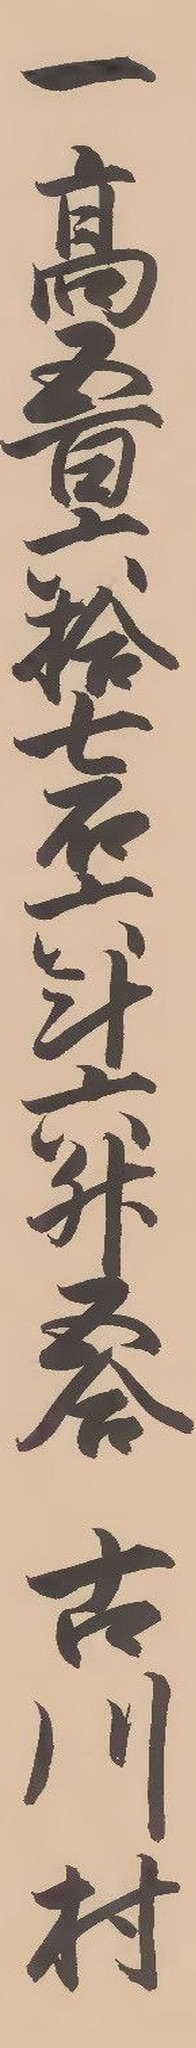一高五百六拾七石六斗六升五合古川村
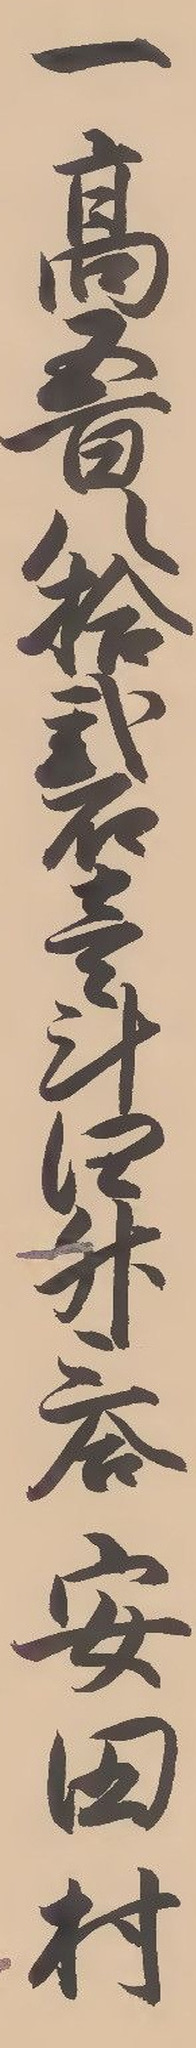一高五百八拾弐石壱斗四升三合安田村

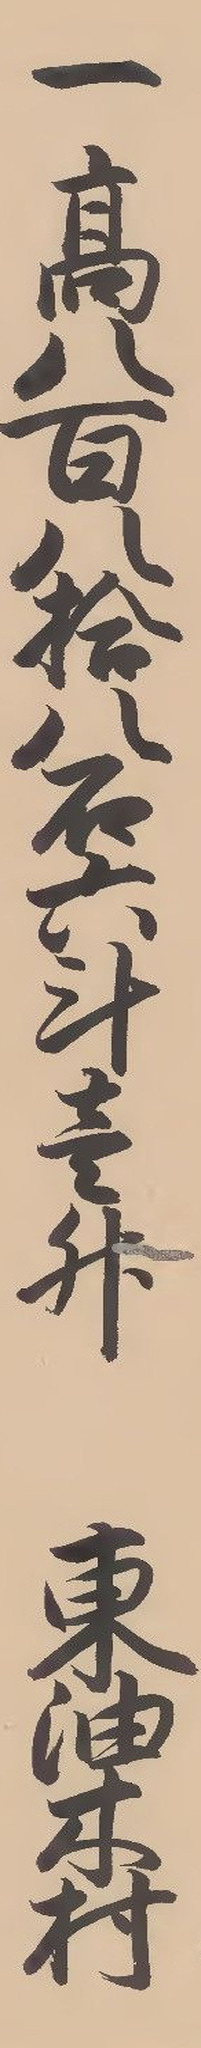一高八百八拾八石六斗壱升東油木村
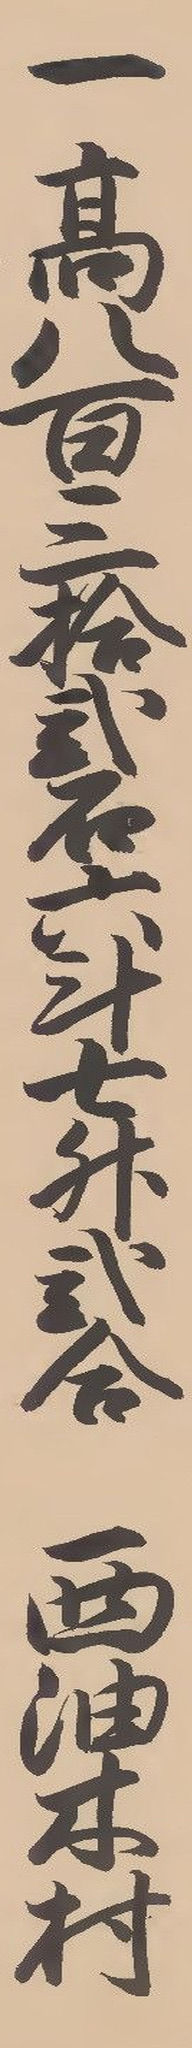一高八百三拾弐石六斗七升弐合西油木村
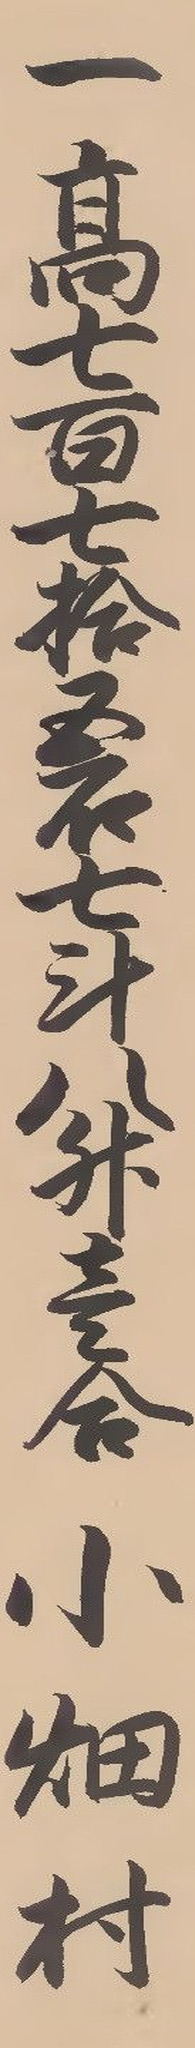一高七百七拾五石七斗八升壱合小畑村
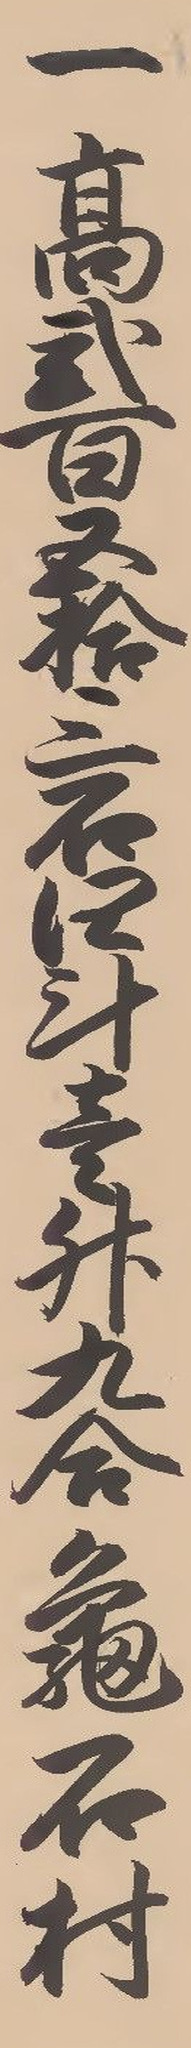一高弐百五拾三石四斗壱升九合亀石村
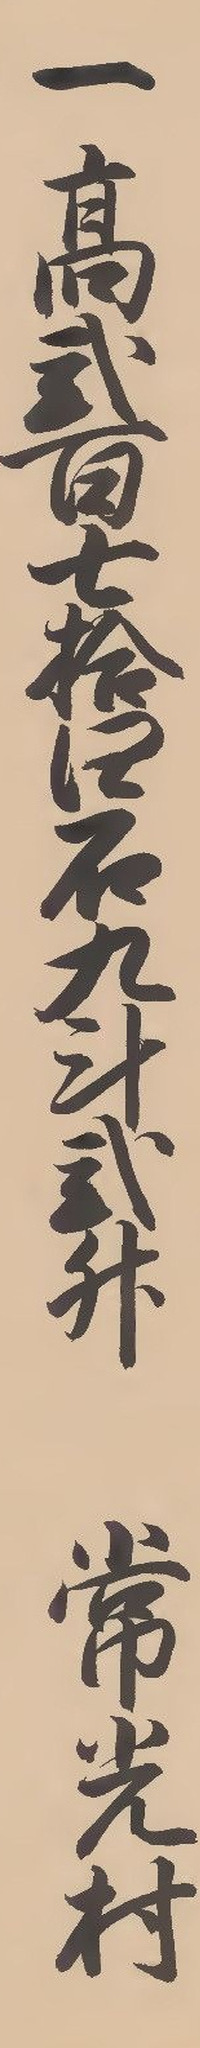一高弐百七拾四石九斗弐升常光村
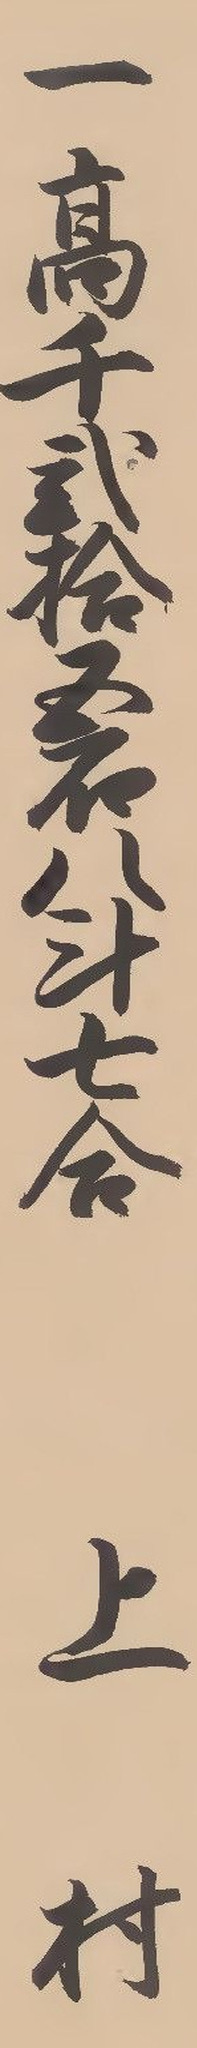一高千弐拾五石八斗七合上村
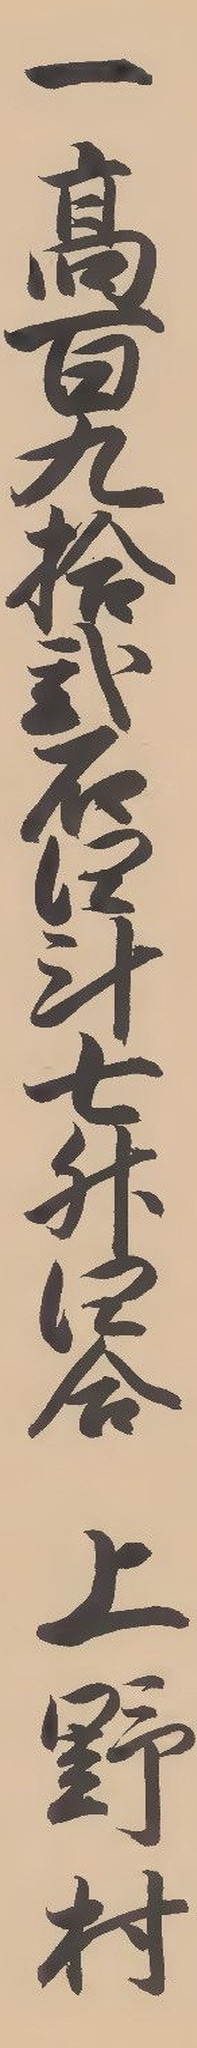一高百九拾弐石四斗七升四合上野村
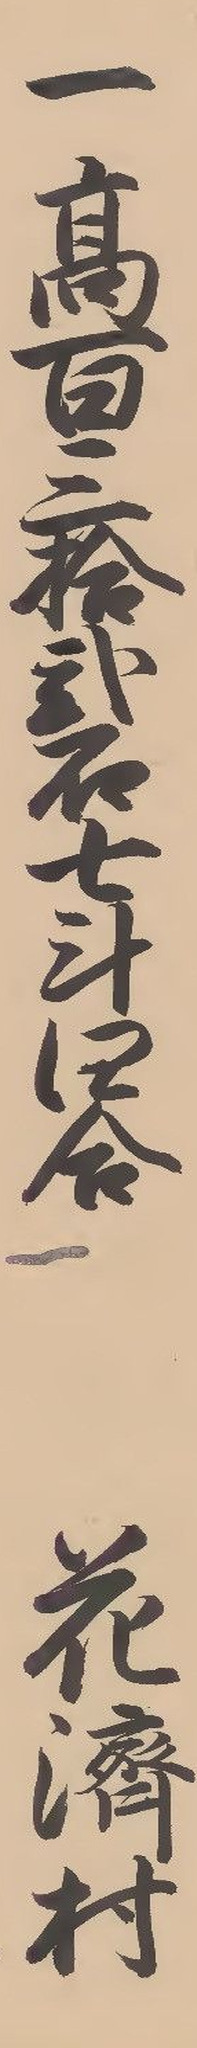一高百三拾弐石七斗四合花済村
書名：備後国郷帳
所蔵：国立公文書館 National Archives of Japan
